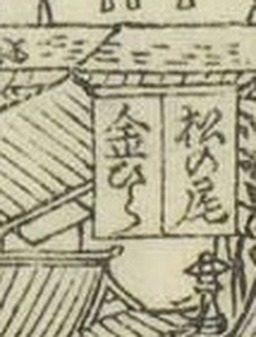金ひら
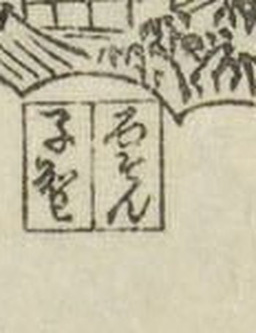石そん
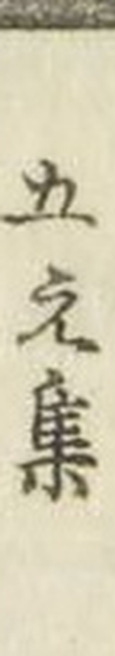五元集
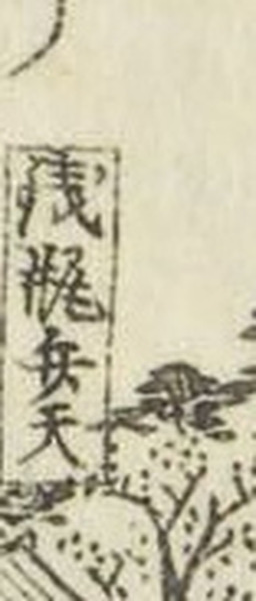銭瓶弁天
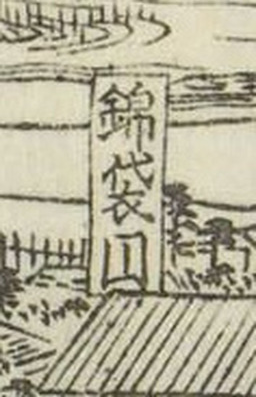錦袋円

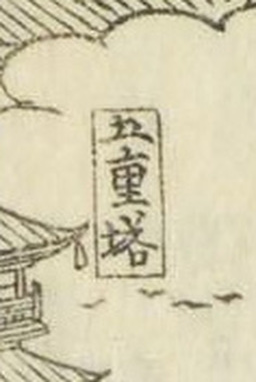五重塔
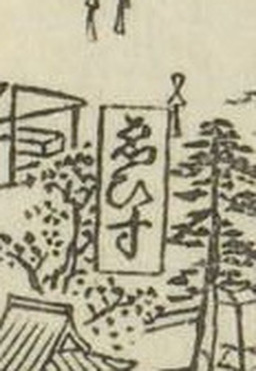ゑひす
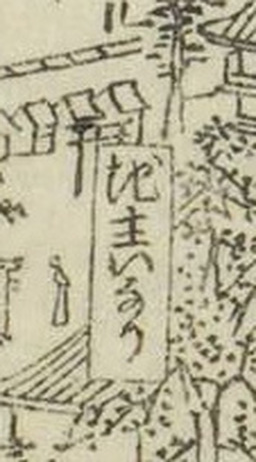地主いなり

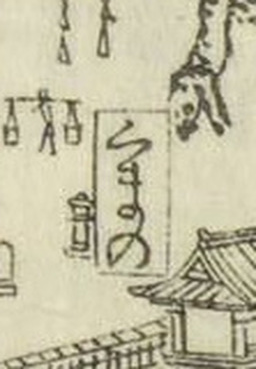くまの
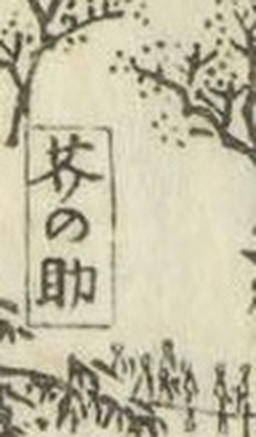芥の助
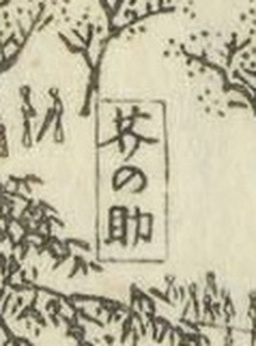芥の助
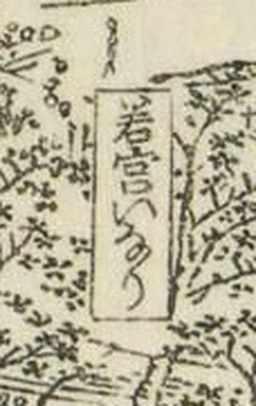若宮いなり
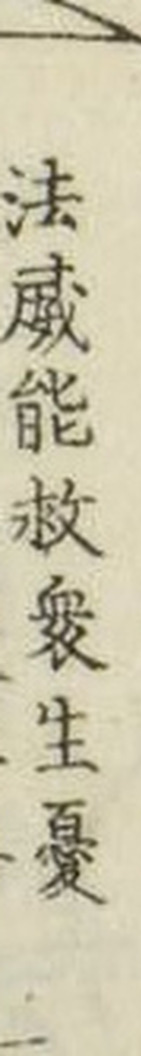法威能救衆生憂
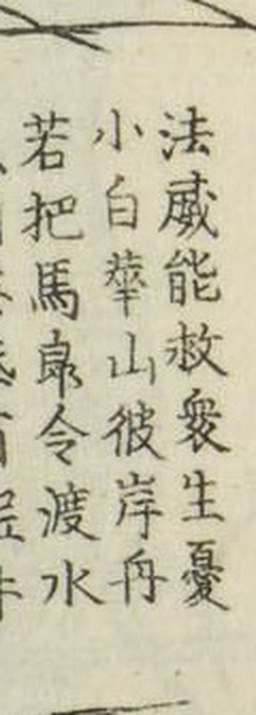小白蕐山彼岸舟
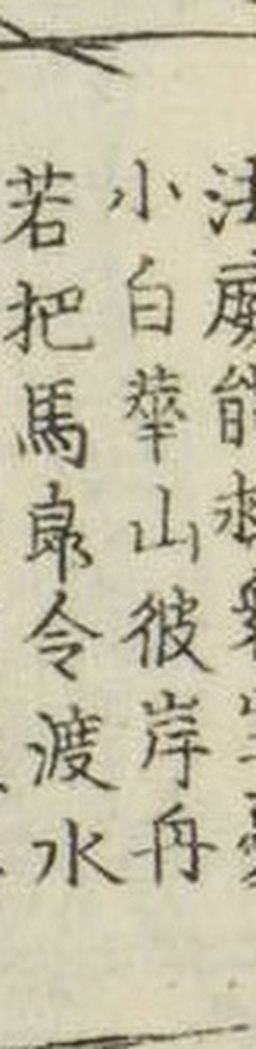若把馬郎令渡水
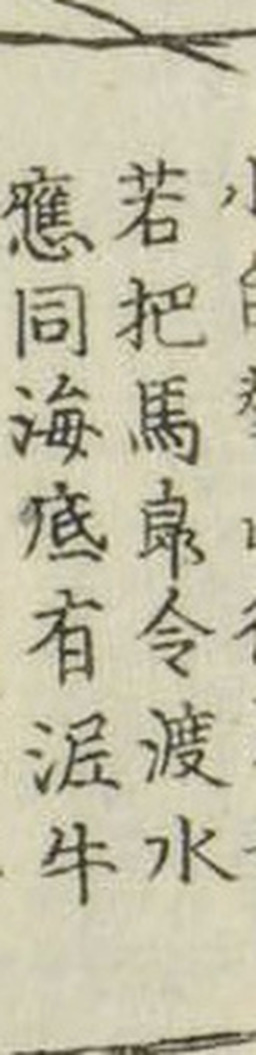應同海底有泥牛
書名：江戸名所図会 20巻 巻之16
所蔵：東京学芸大学教育コンテンツアーカイブ
